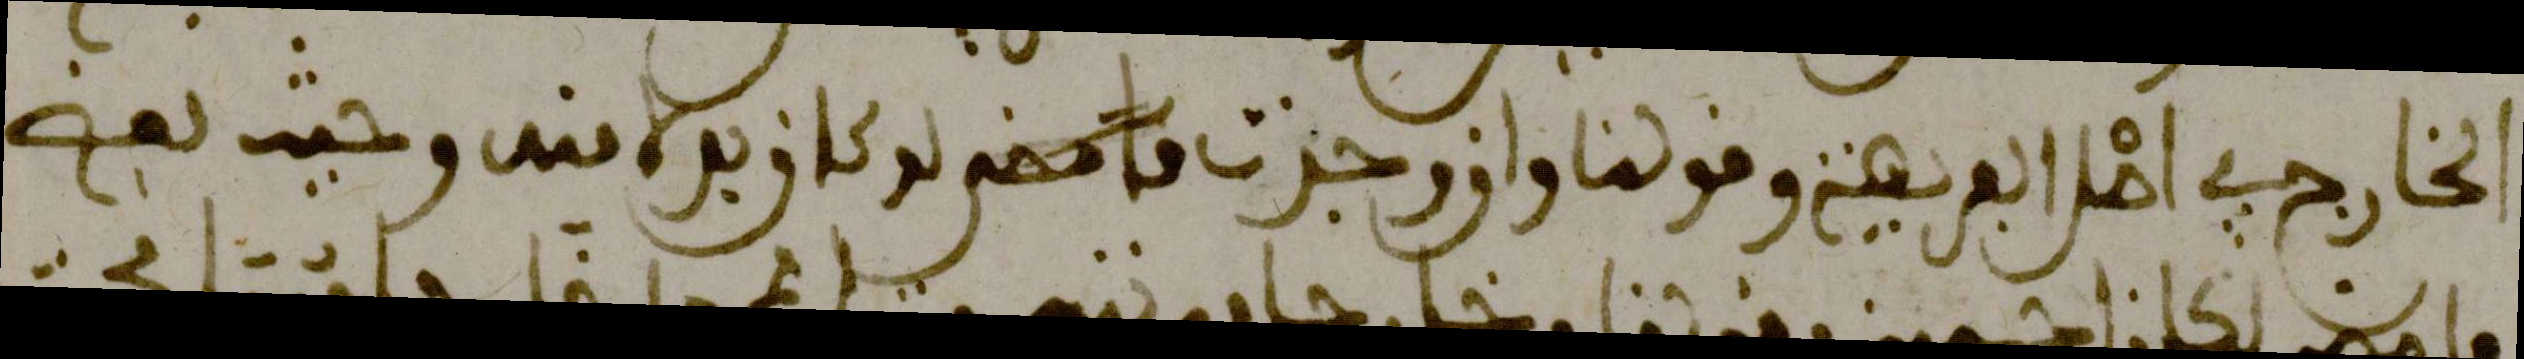الخارج في اصْل الفريضة وقولنا وان وجدت ما مضى لكان بد لا منه وحيث بعض
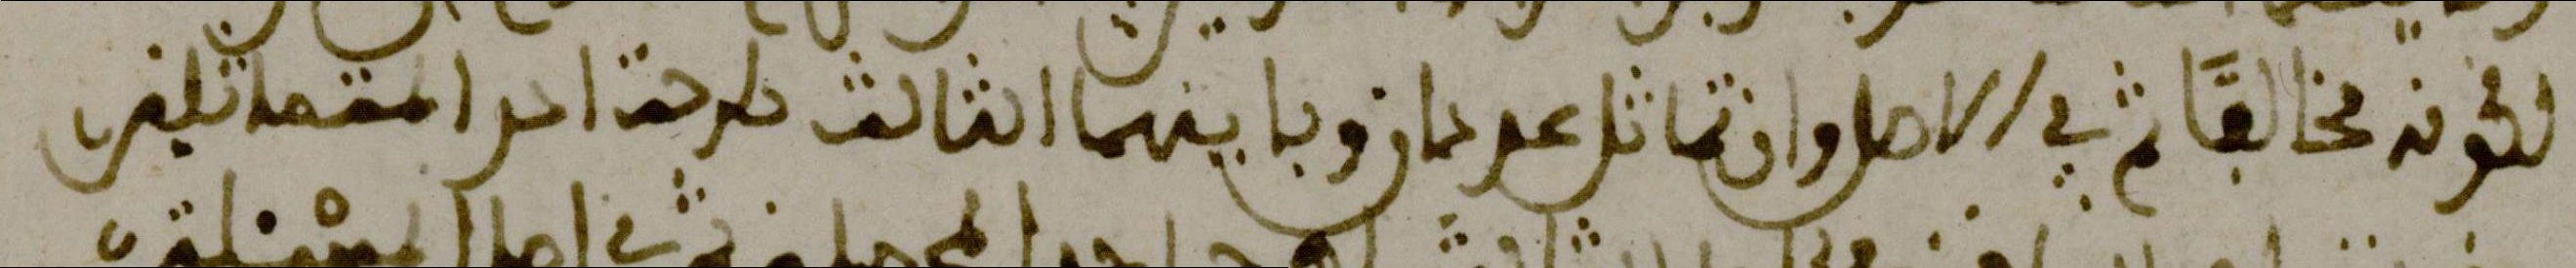لكونه مخالفًا ثم في الاصل وان تماثل عددان وباينهما الثالث طرحت احد المتماثلين
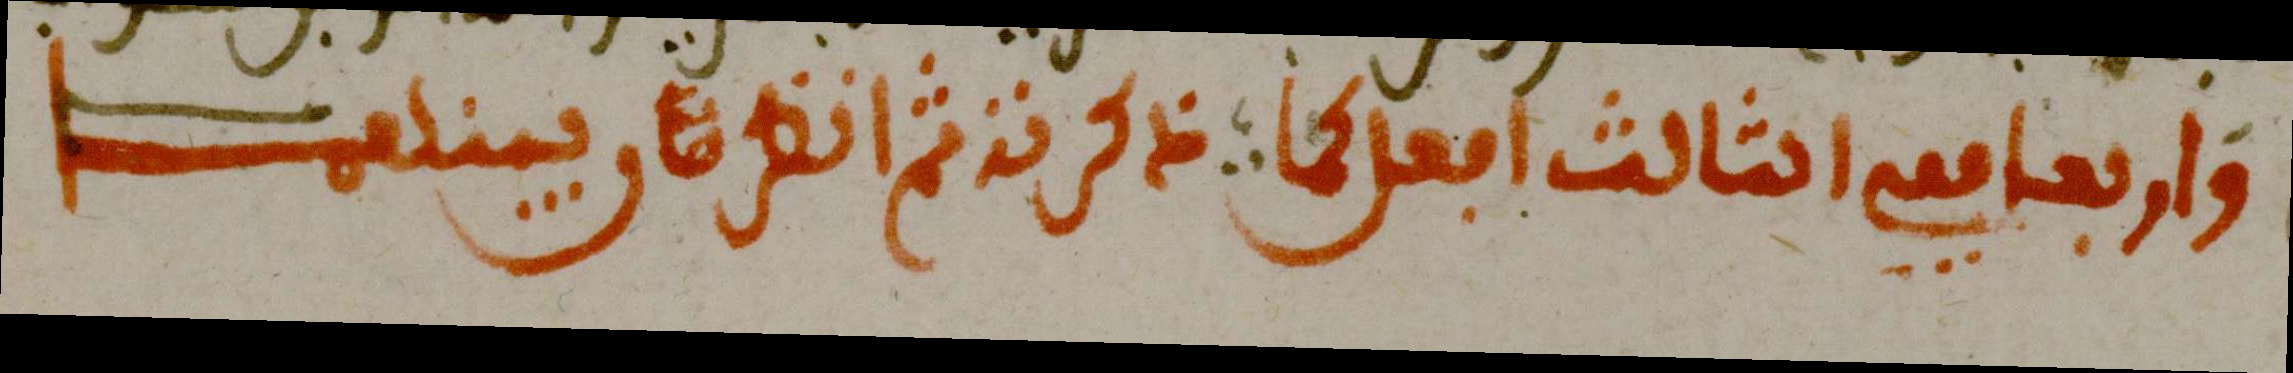وَاربعا ففي الثالث افعل كما ذكرته ثم انظرن ن بينهمَا
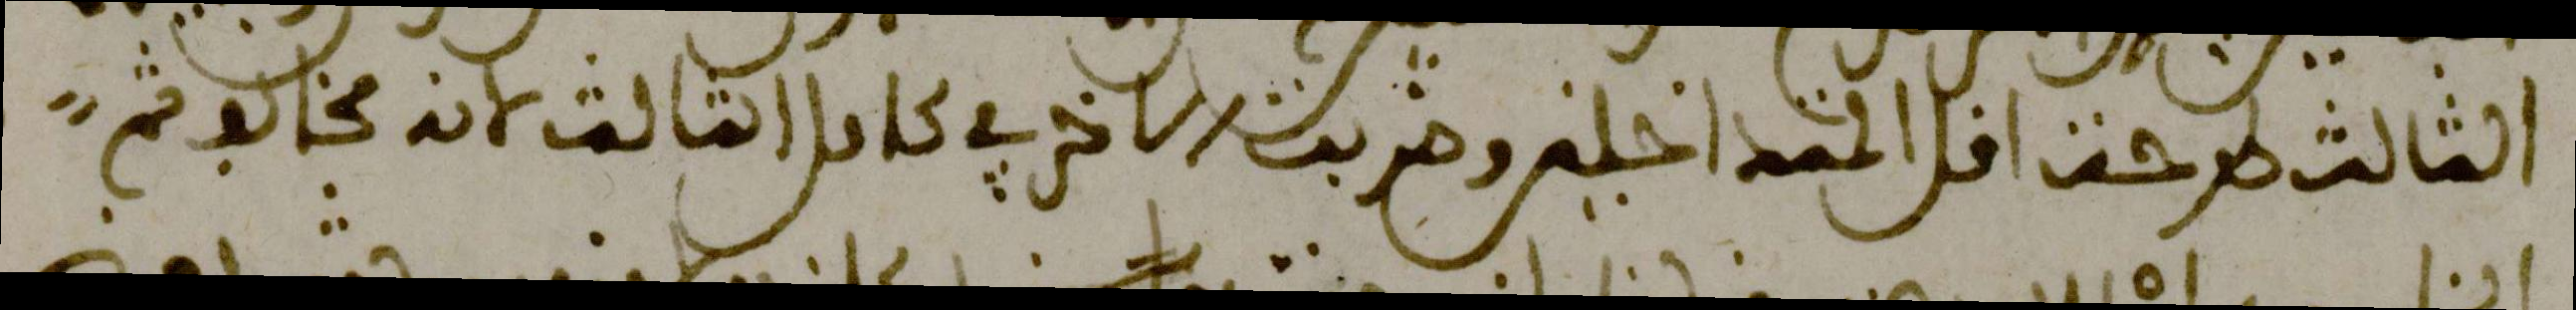الثالث طرحت اقل المتداخلين وضربت الاخر في كامل الثالث لانه مخالف ثم
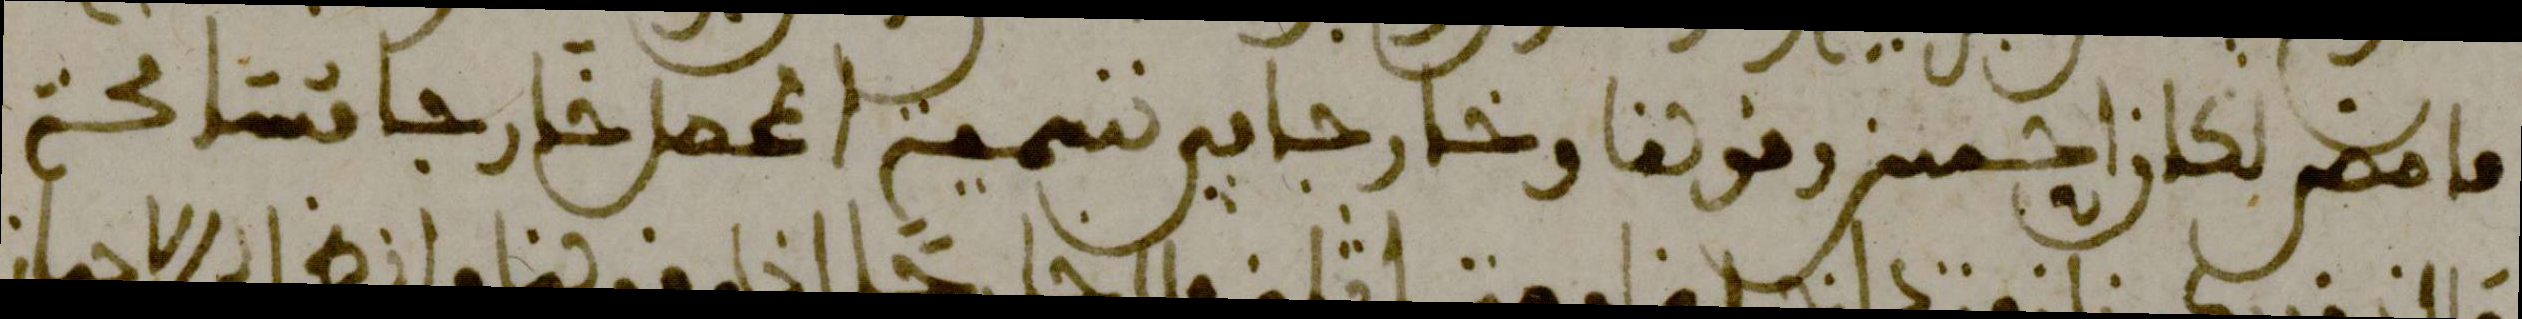ما مضى لكان احسن وقولنا وخارجا في تسمية المحصل خَارجا مُسَامحة
